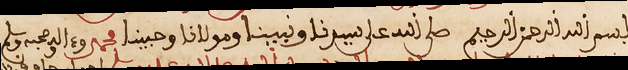بسم الله الرحمن الرحيم صلى الله على سيدنا ونبينا ومولانا وحبينا محمد وءاله صحبه وسلم
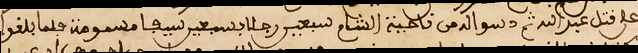على قتل عبد الله ثم دسوا له من ناحية الشام سبعين رجلا بسبعين سيفا مسمومة فلم بلغوا
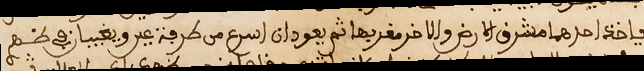يأخذ احدهما مشرق الأرض والأخر مغربها ثم يعودان اسرع من طرفة عين ويغيبان في ظهره
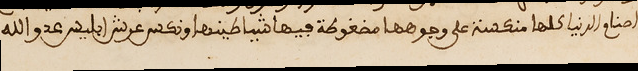اصنام الدنيا كلها منكسة على وجهها مضغوطة فيها شياطينها ونكس عرش ابليس عدو الله
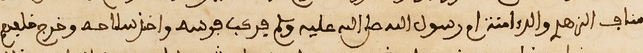مناف الزهرى والد ءامنة ام رسول الله صلى الله عيله وسلم فركب فرسه واخذ سلاحه وخرج خلفهم
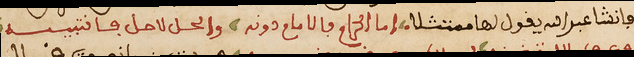فانشا عبد الله يقول لها ممتثلا اما الحرام فالامام دونه والحل لا حل فانتبيه
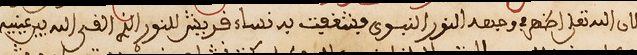لان الله تعلى اظهر في وجهه النور النبوى فشغفت به نساء قريش للنور الذي القى الله بين عينيه
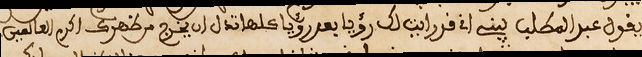يقول عبد المطلب يبنى انى قد رايت لك رؤيا بعد رؤيا كلها تدل ان يخرج من ظهرك اكرم العالمين
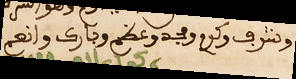وشرف وكوم ومجد وعظم وبارك وانعم
